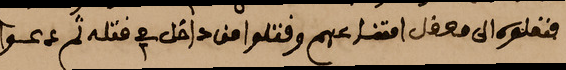فنقلوه الى معقل امتناعهم وقتلوا من داخل في قتله ثم دعوا
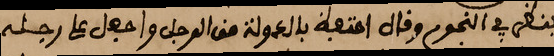ينظر في النجوم وقال احتفظ بالدولة من الرجل واجعل على رجله
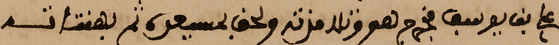علي بن يوسف فخرج هو وتلامذته ولحق بمسيعده ثم بهنتاته
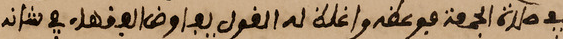في صلاة الجمعة فوعظه واغلظ له القول يفاوض الفقهاء في شانه
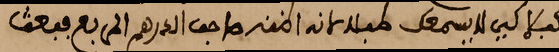كبلا كي لا يسمعك طبلا لانه اظنه صاحب الدرهم المربع فبعث
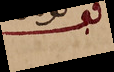قف
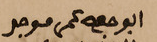ابو حفص عمر موجد
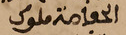الحفاصة ملوك
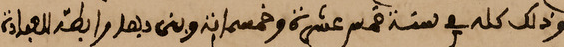وذلك كله في سنة خمس عشرة وخمسماية وبنى بها رابطة للعبادة
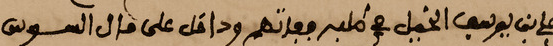علي بن يوسف الخيل في طلبه ففاتهم وداخل على مال السوس
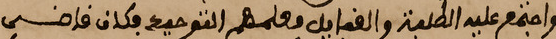واجتمع عليه الطلبة والقبايل فعلمهم التوحيد فكان قاضي
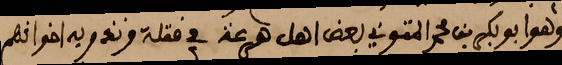وهو ابو بكر بن محمد المتوني بعض اهل هرعة في قتله ونذر به إخوانهم
